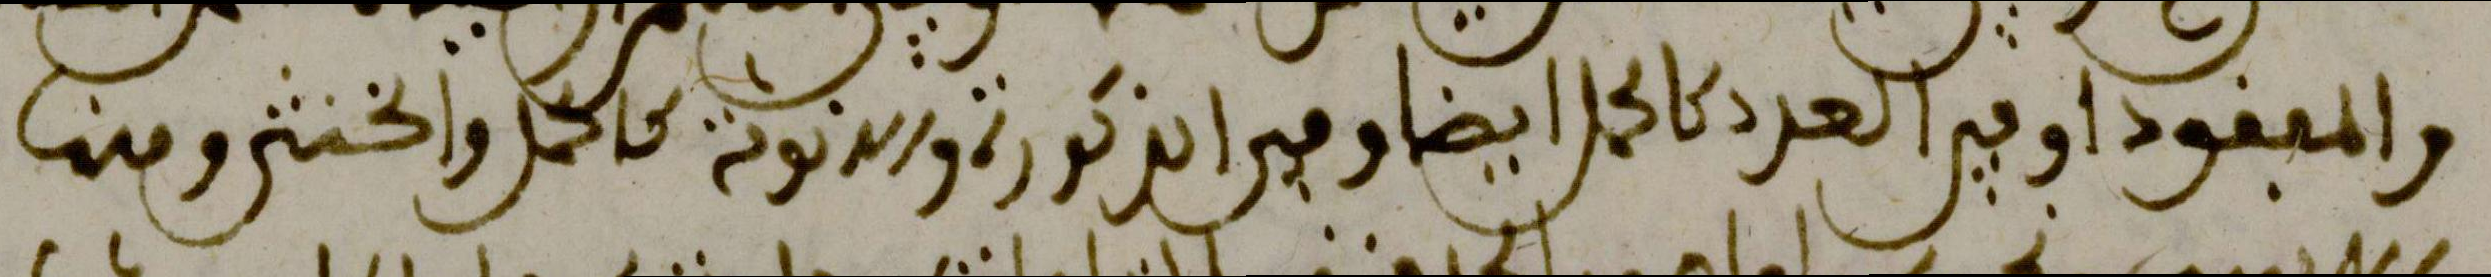و المفقود او في العدد كالحمل ايضا و في الذكورة و الانوثة كالحمل و الخنثى و منها
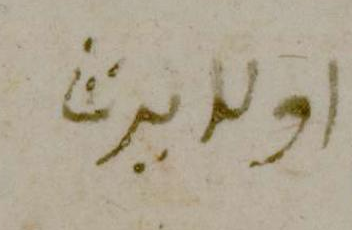او لا يرث
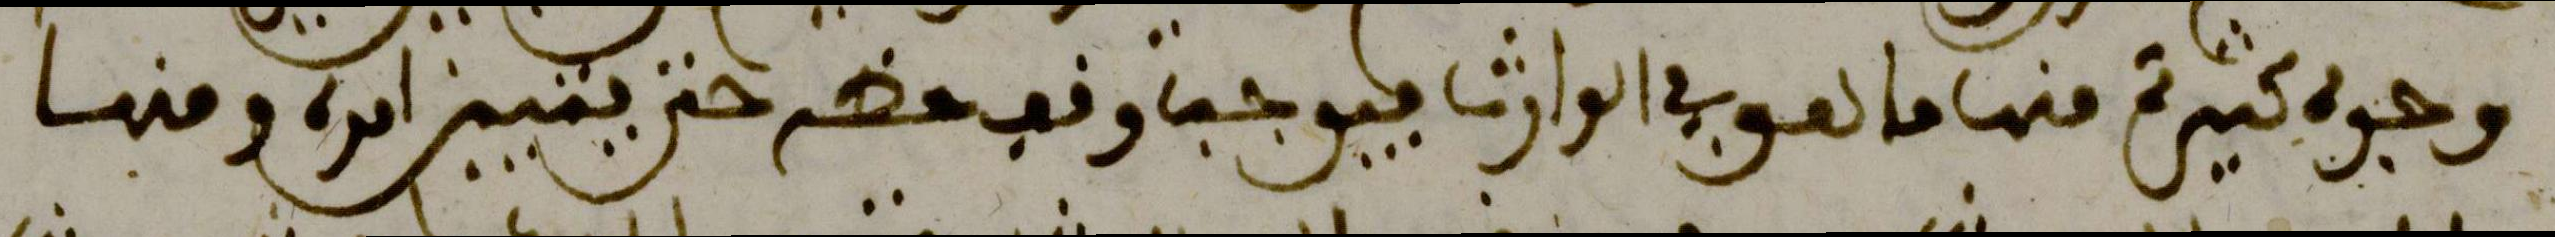وجوه كثيرة منها ما هو في الوارث فيوجب وقف حظه حتى يتبين امره و منها
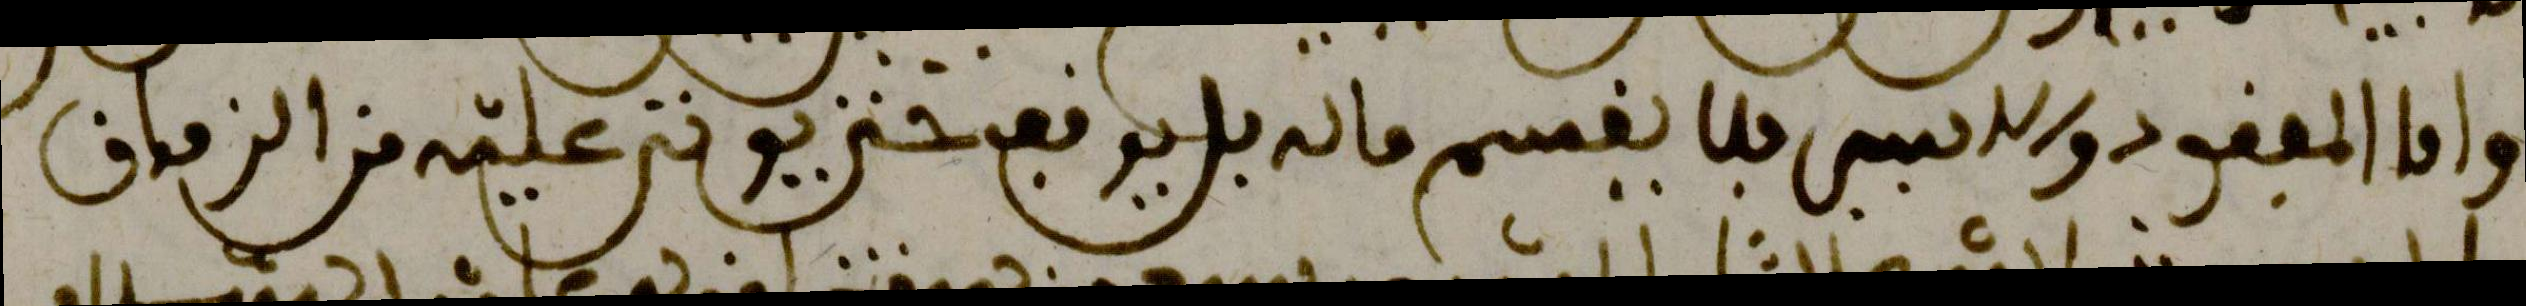و اما المفقود و الاسير فلا يقسم ماله بل يوقف حتى يوتى عليه من الزمان
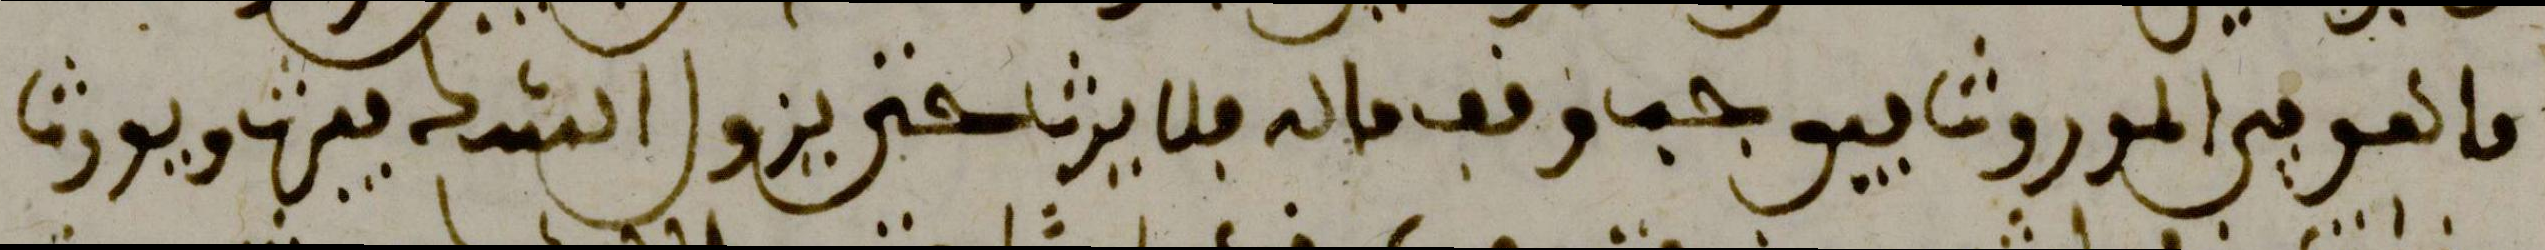ما هو في الموروث فيوجب وقف ماله فلا يرث حتى يزول الشك فيرث و يورث
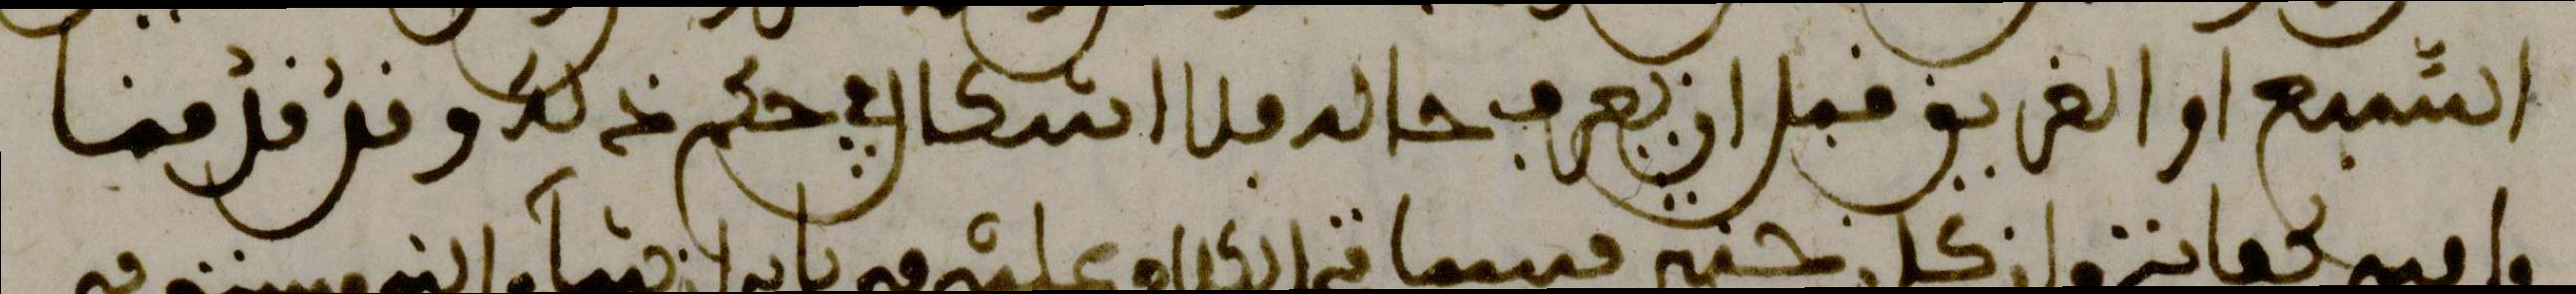السّبع او الغريق قبل ان يعرف حاله فلا اشكال في حكم ذلك و قد قدمنا
